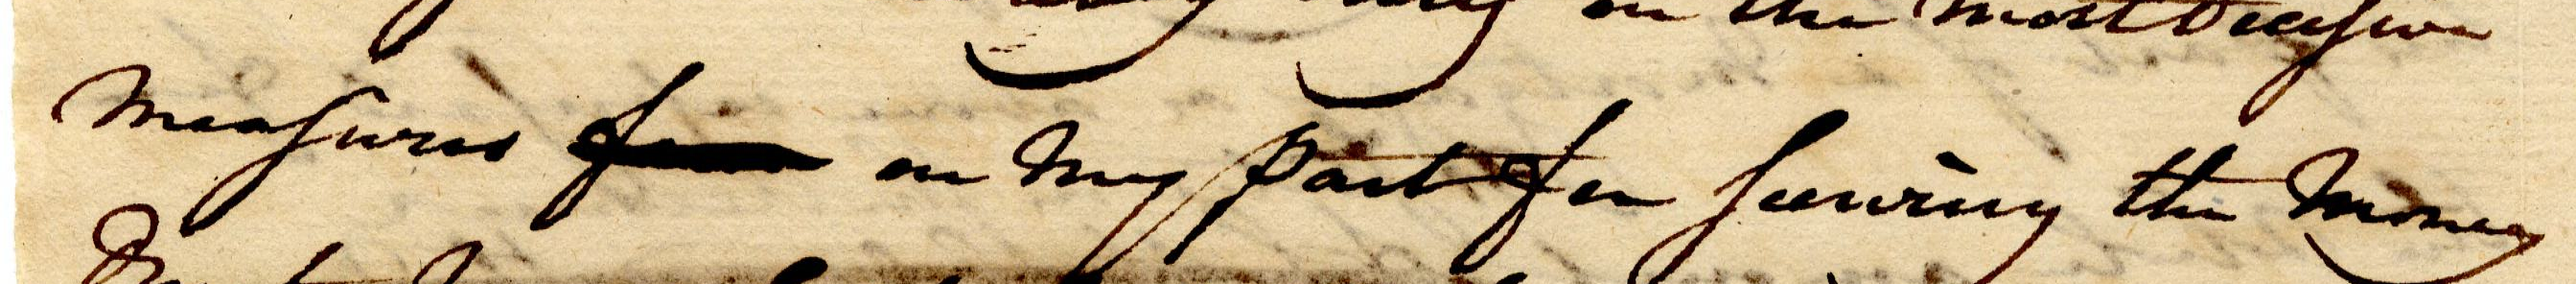measures [for] on my part for securing the money
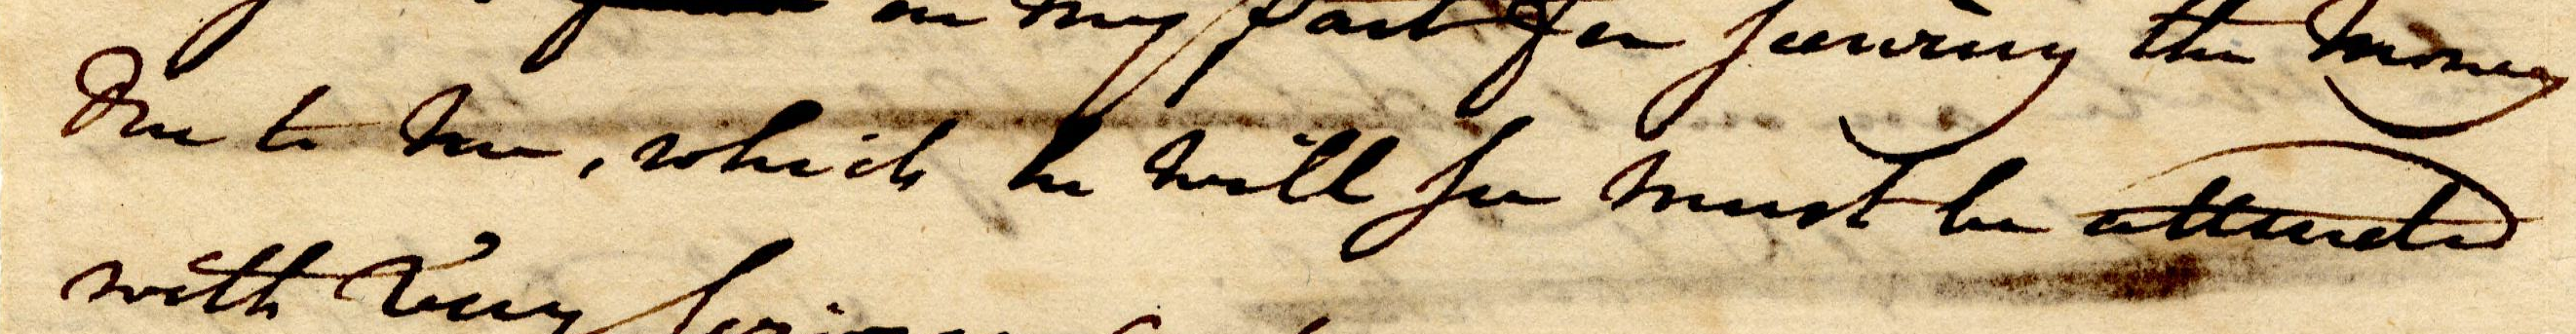due to me, which he will see must be attended
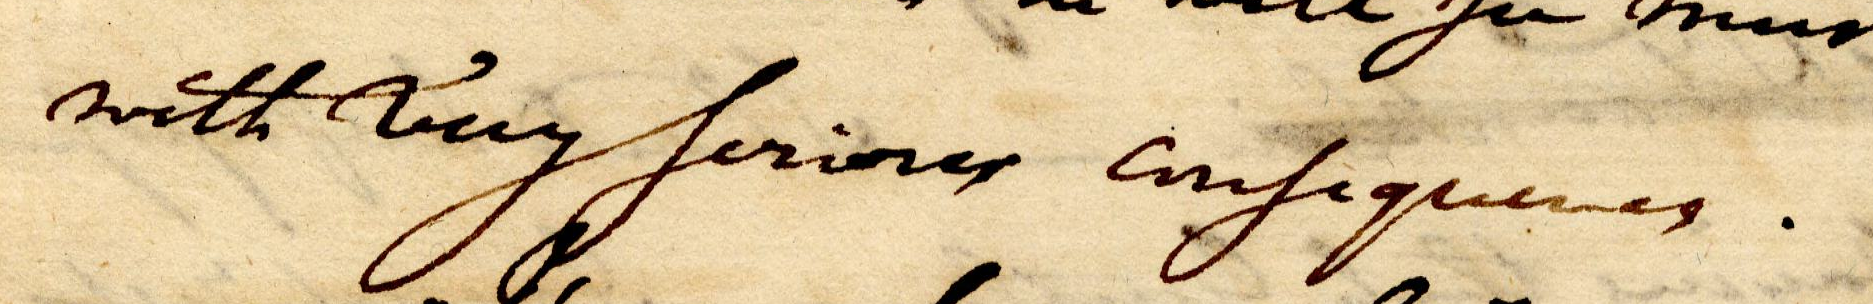with very serious consequences.
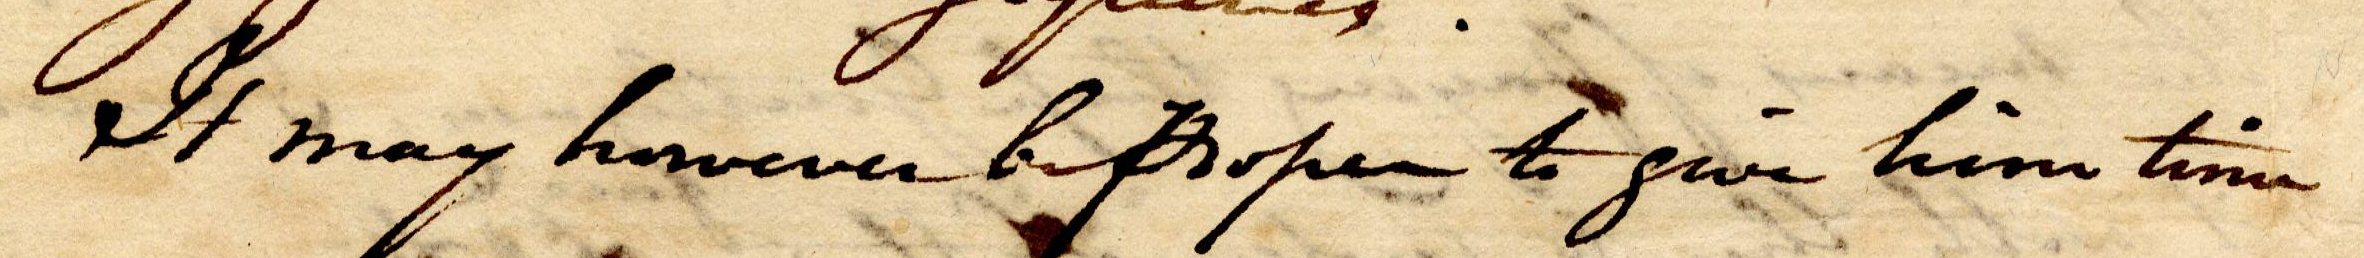It may be proper however to give him time
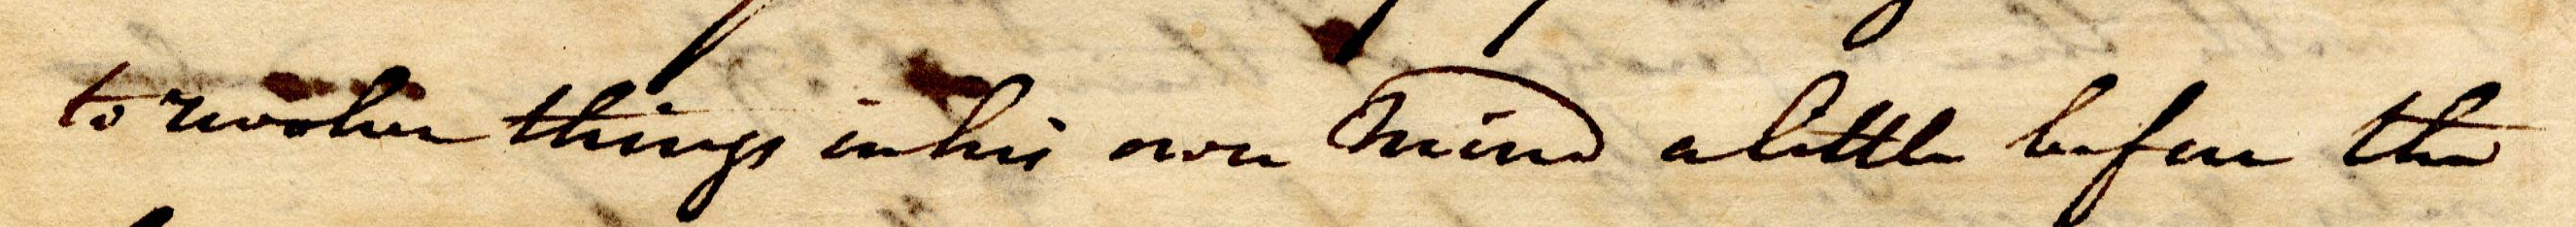to revolve things in his own mind a little before the
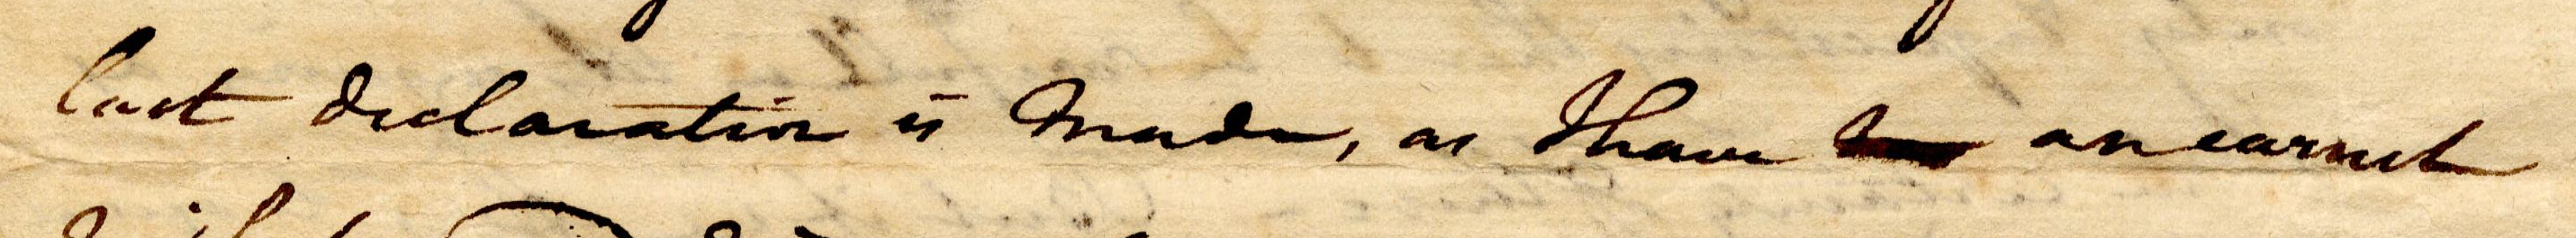last declaration is made, as I have [__] an earnest
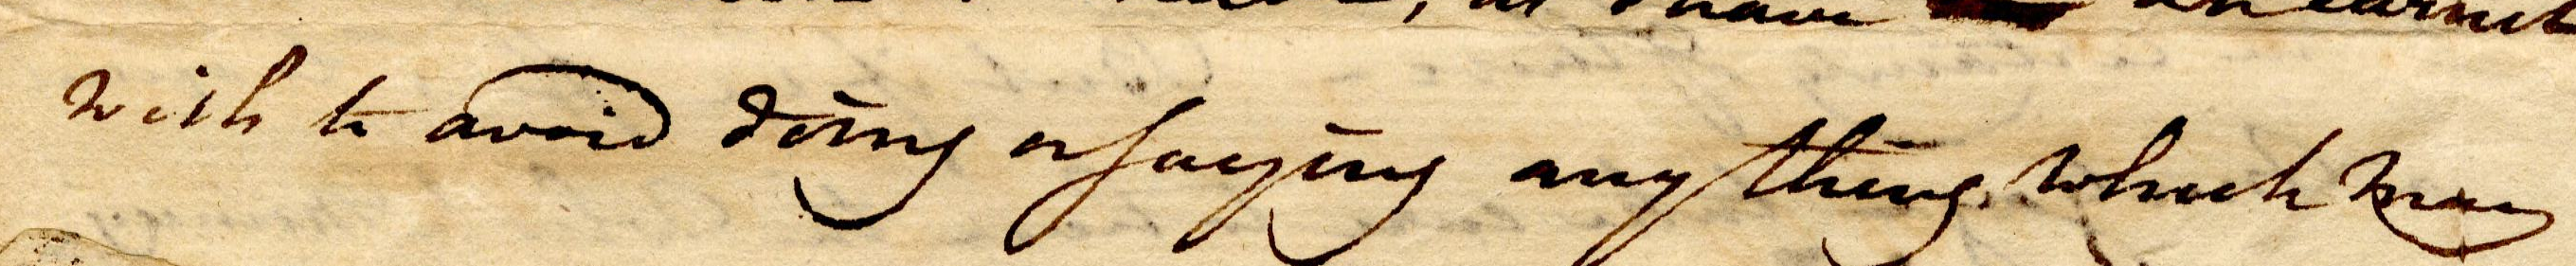wish to avoid doing or saying anything which may
